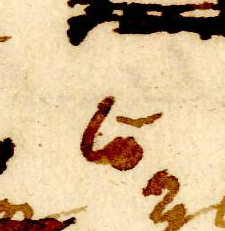to
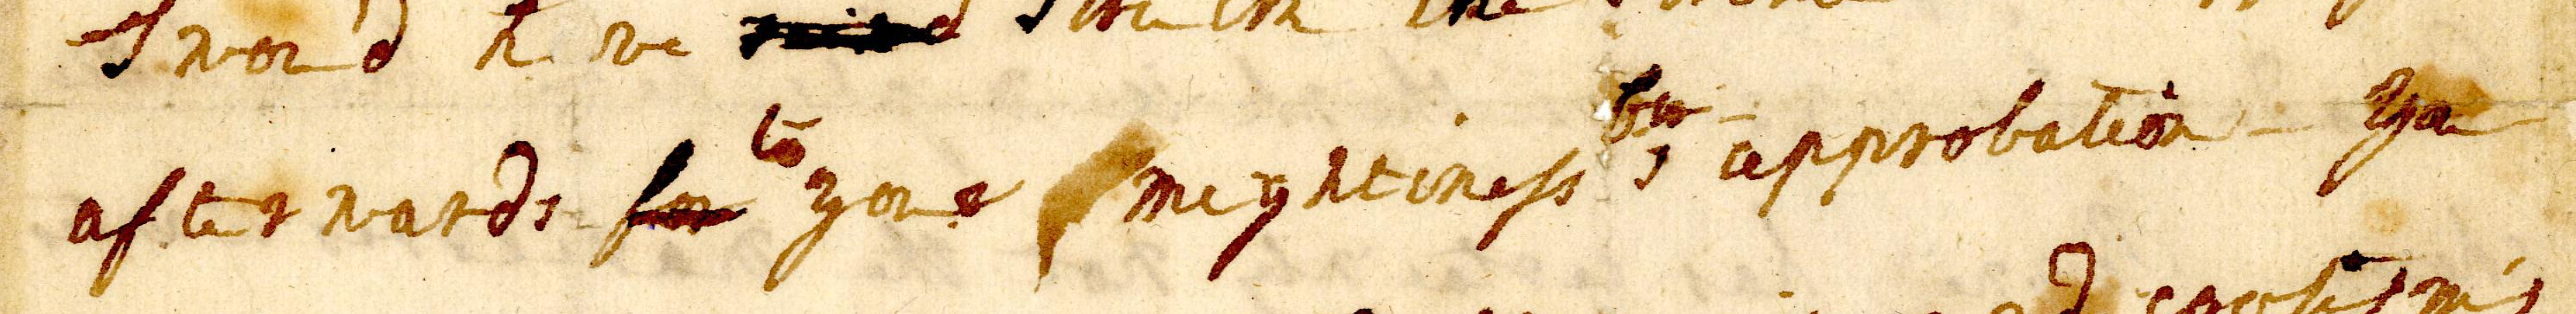after wards [for] your mightiness's approbation- you
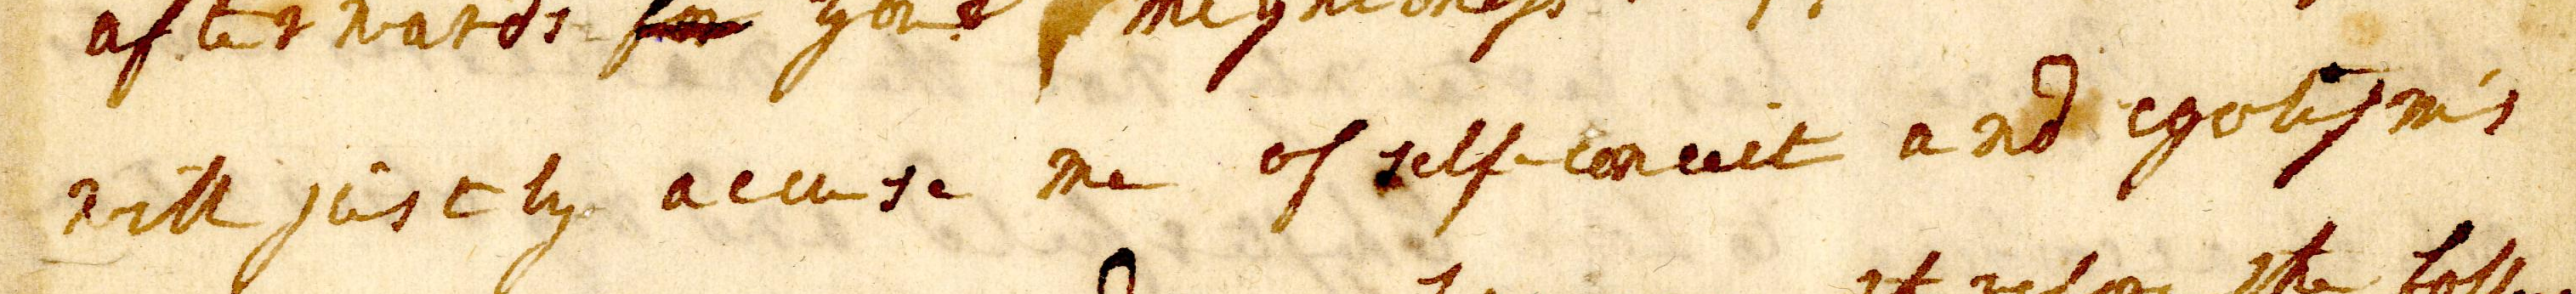will justly accuse me of self-conceit and egotism
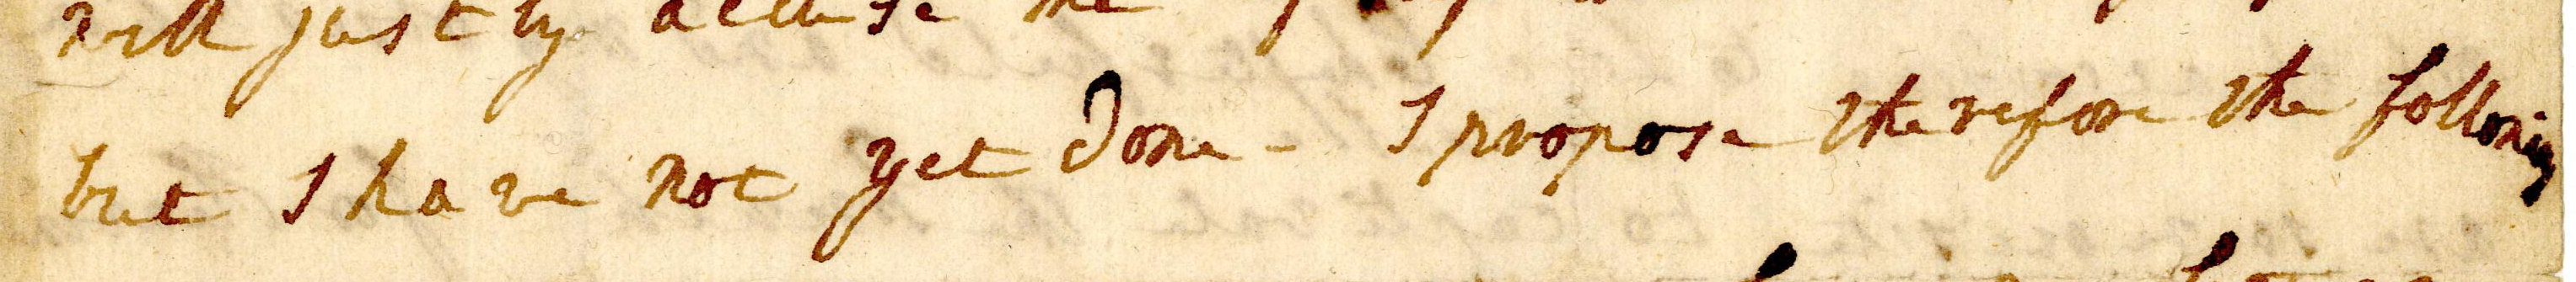but I have not yet done- I propose therefore the following
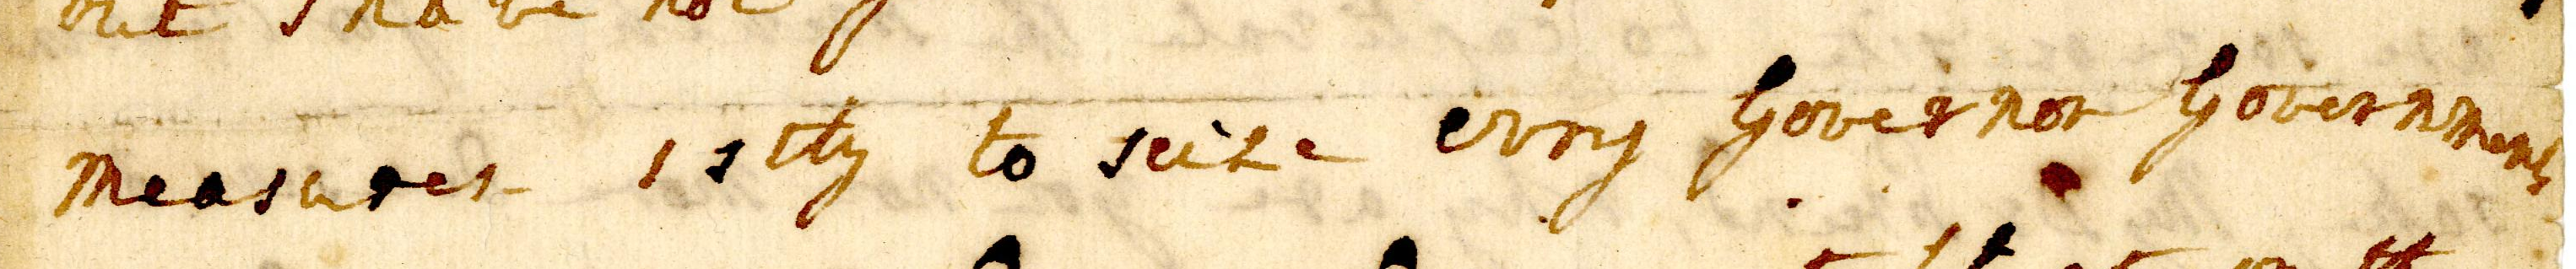measures 1stly to seize every Governor Governments
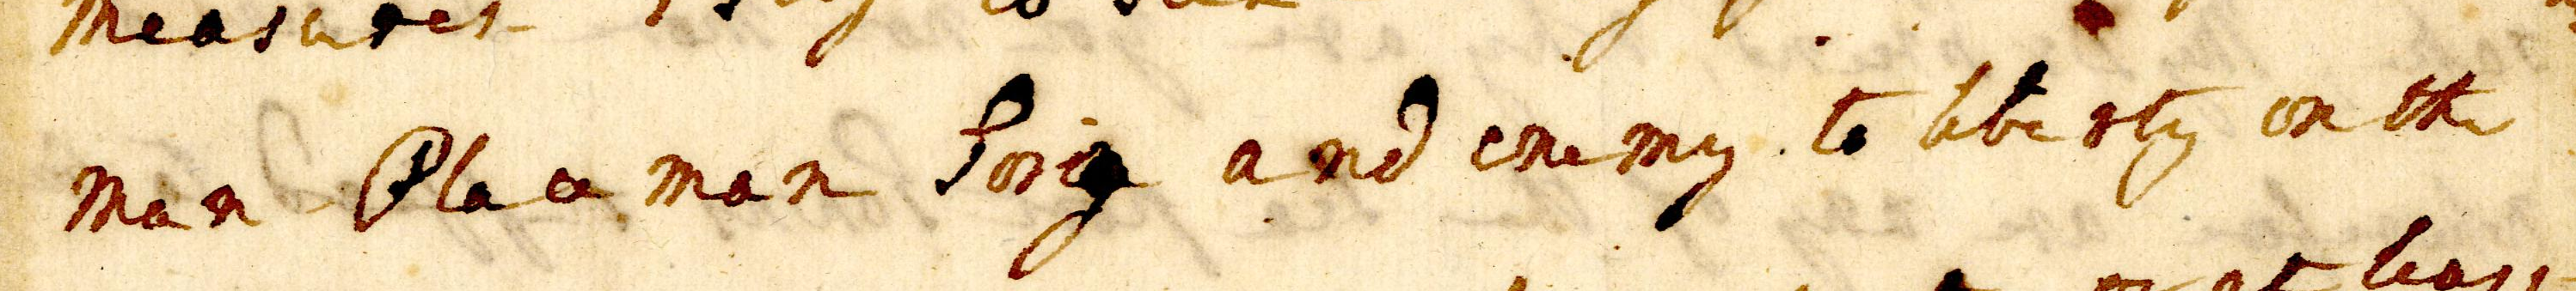man Place man Song and enemy to liberty on the
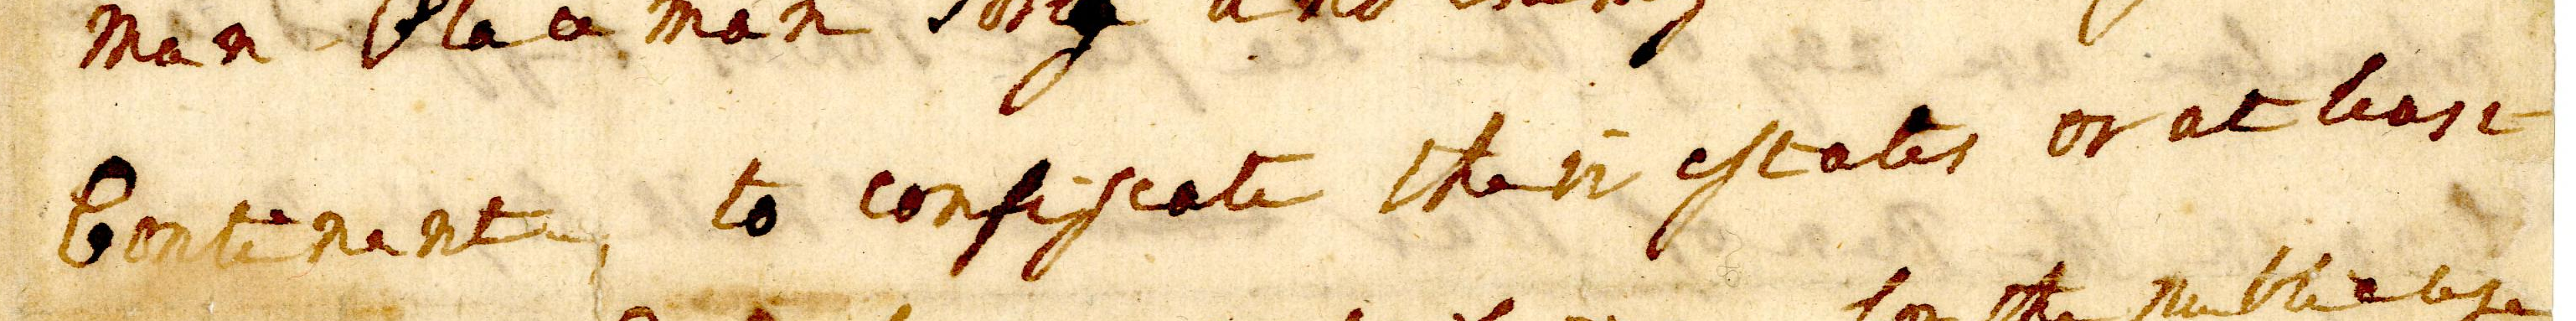Continent, to confiscate their estates or at least
